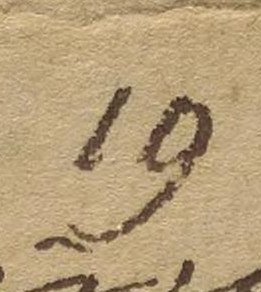19
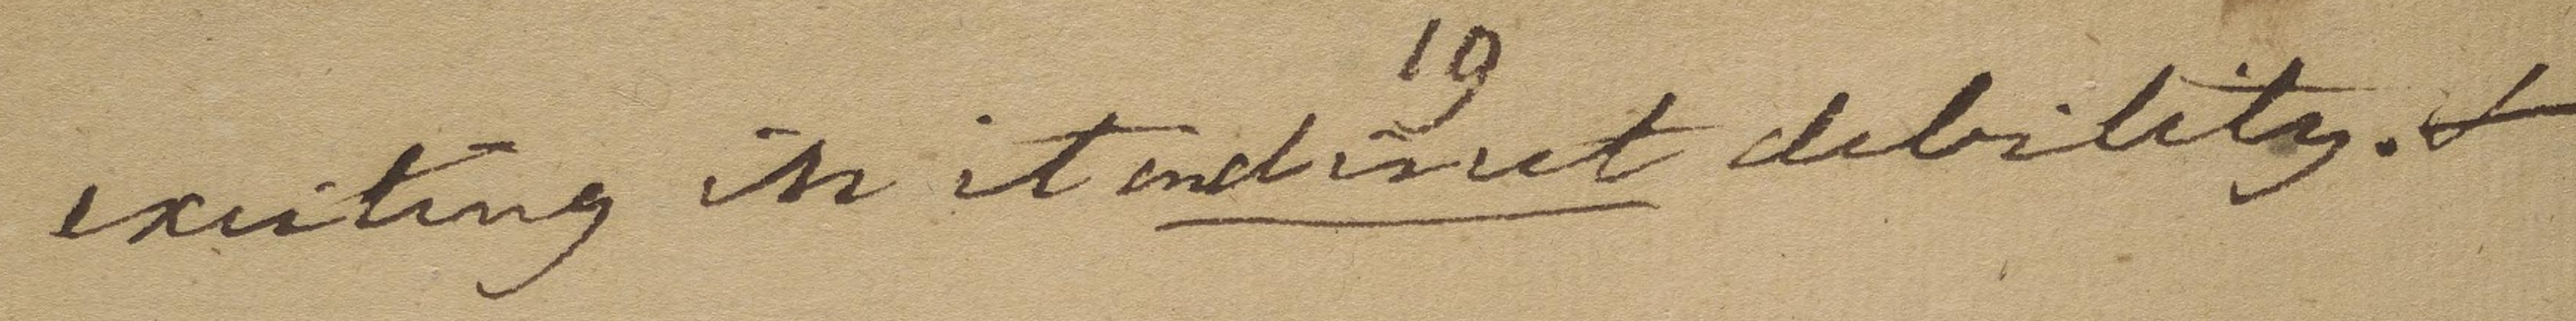exciting in it indirect debility.
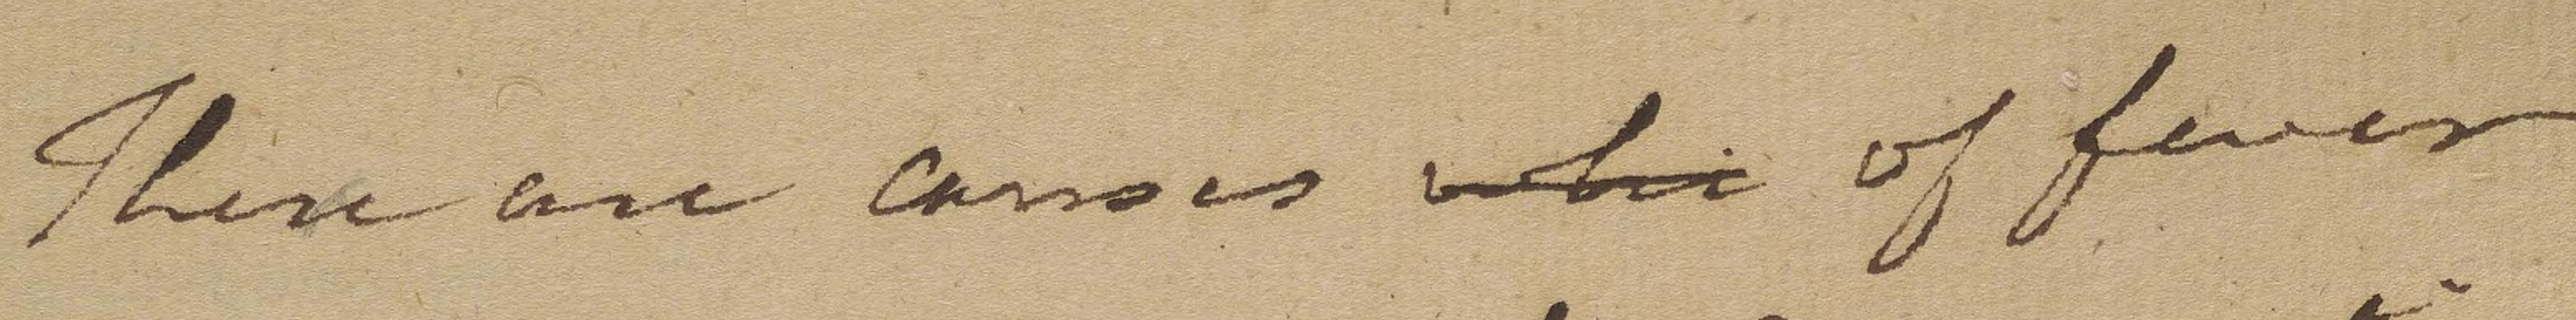There are causes [whi] of fever
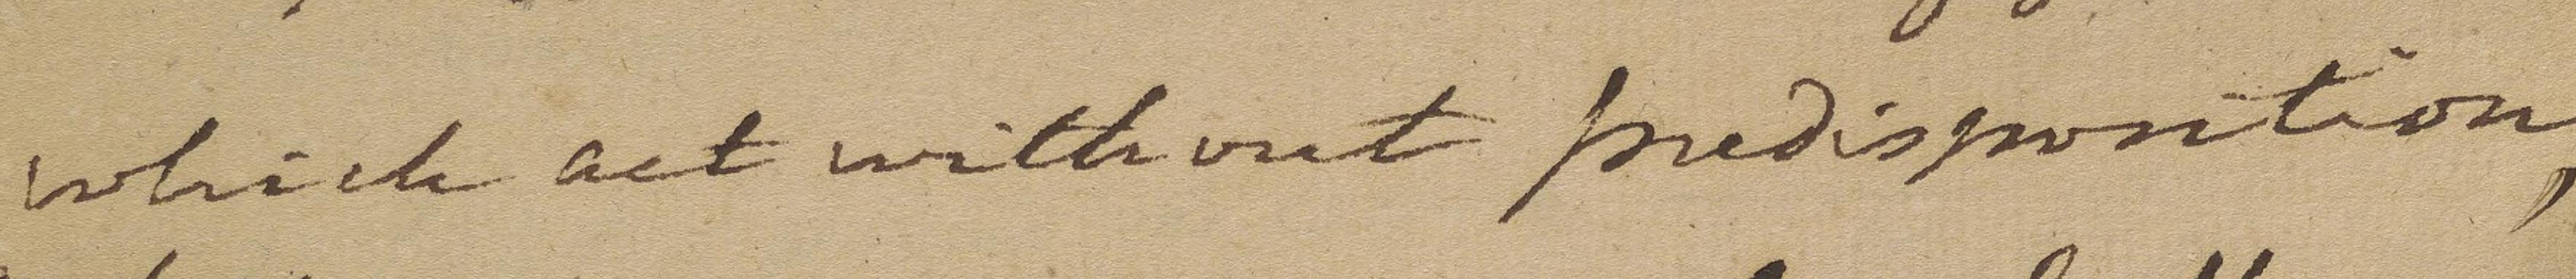which act without predisposition
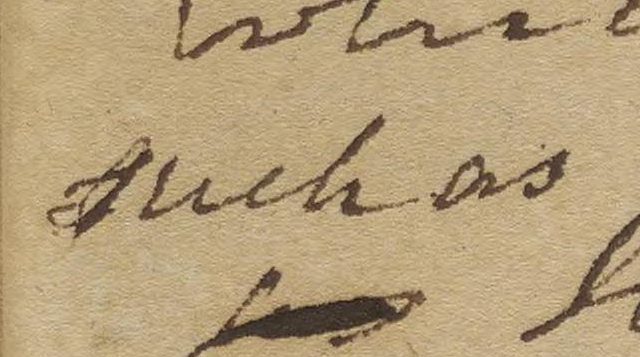such as
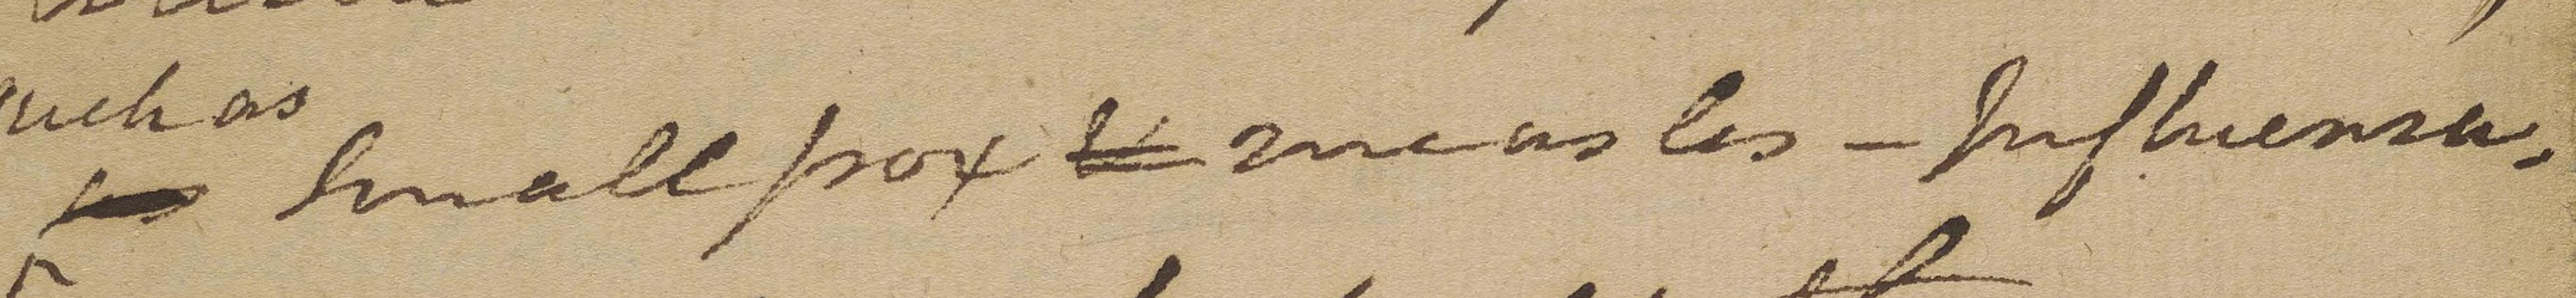^ [as] smallpox & measles, Influenza,
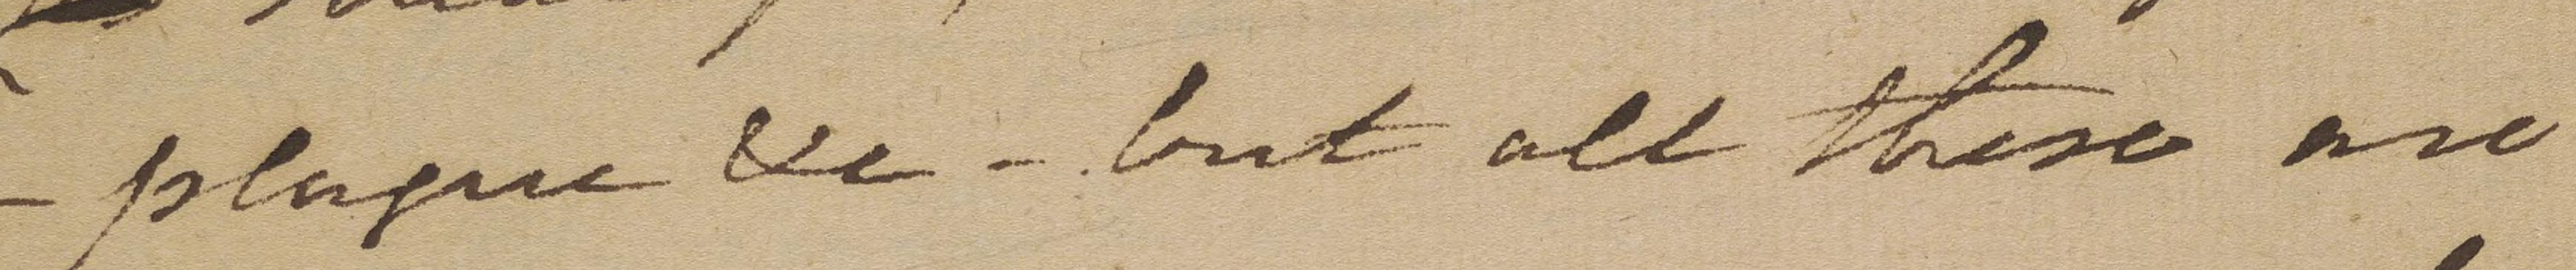plague &c- but all these are
